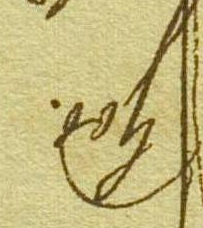God.
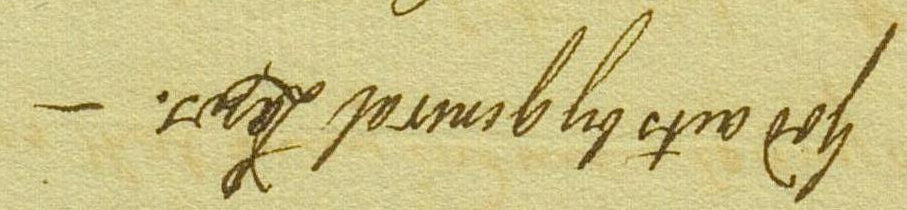God acts by general Laws.-
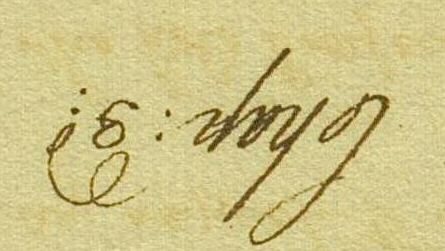Chap: 3^d:
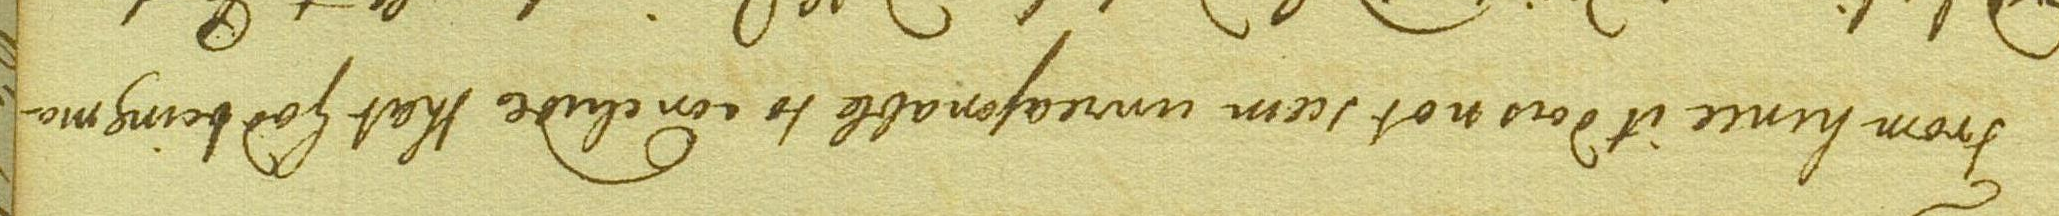From hence it does not seem unreasonable to conclude that God being mo-
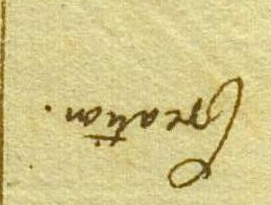Creation.
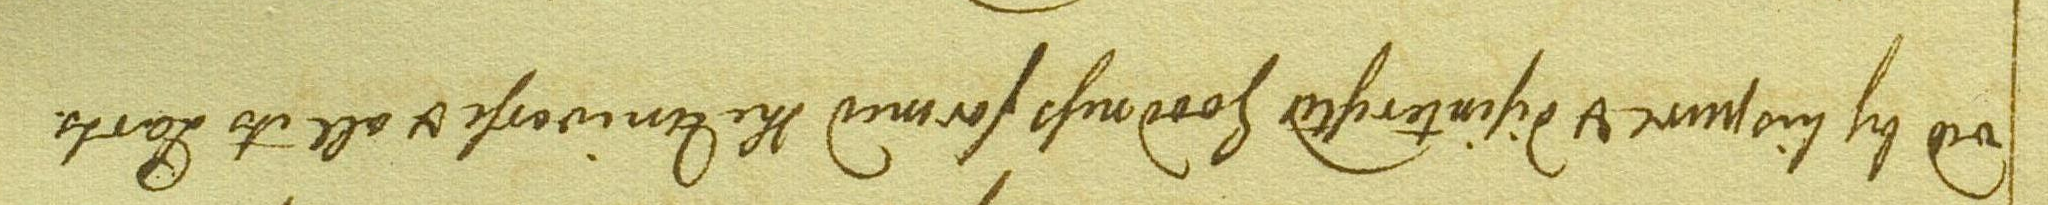ved by his pure & disinterested Goodness formed the Universe & all its Parts.
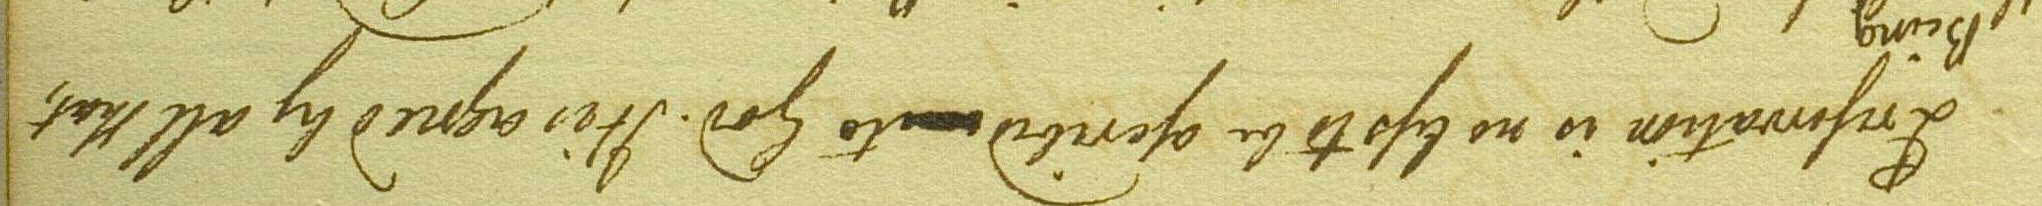Preservation is no less to be ascribed [un]to God. It is agreed by all that,
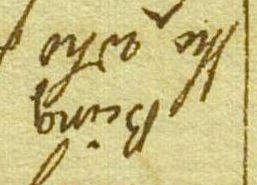Being
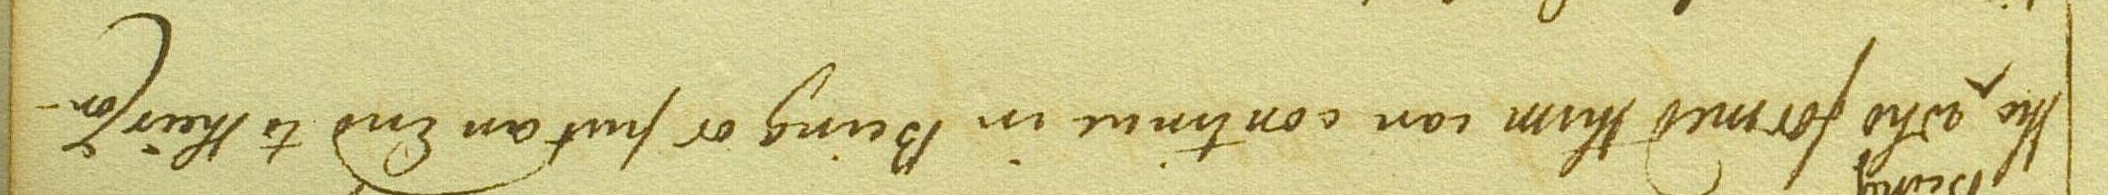the ^ who formed them can continue in Being or put an End to their Con-
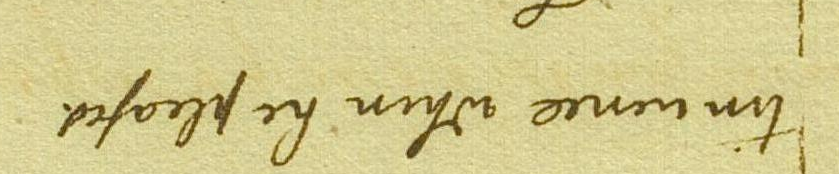-tinuence when he pleases.
